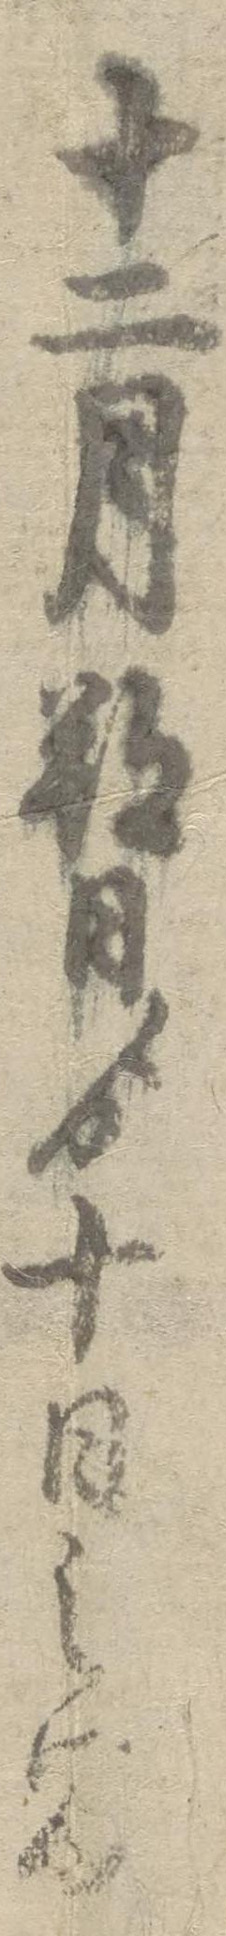十二月朔日より十日の間
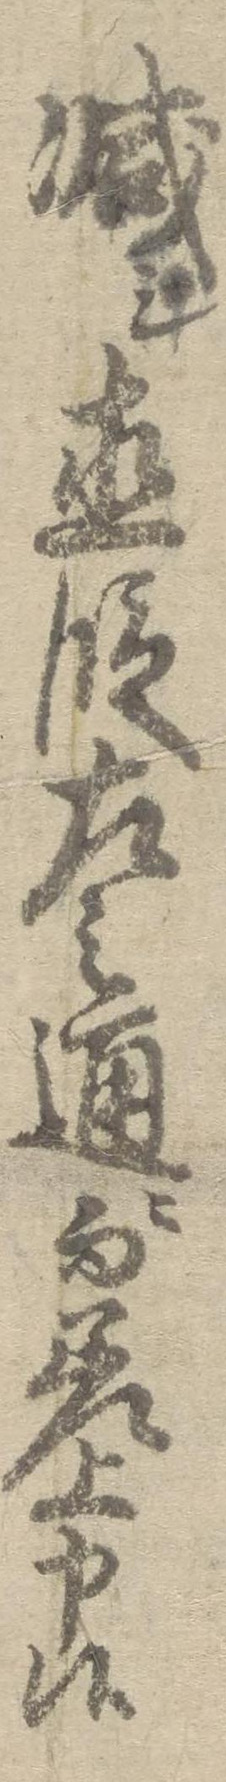減直段左の通差上申候
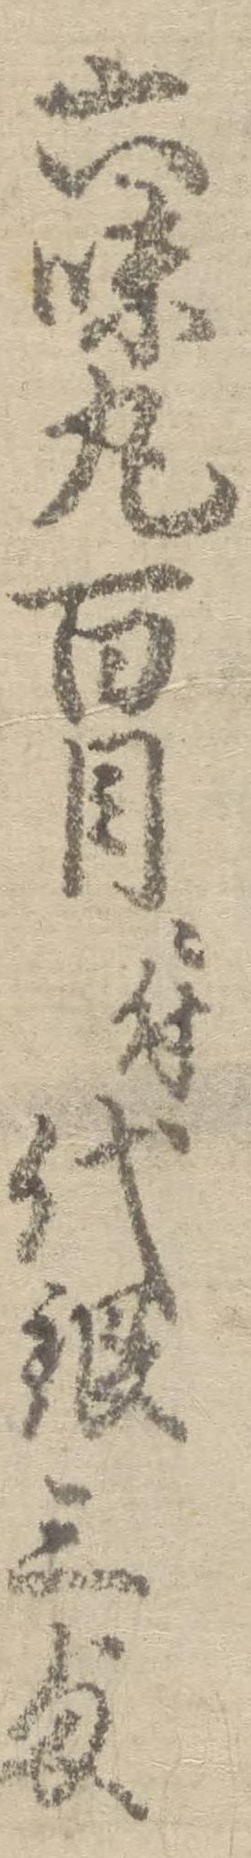六味丸百目付代銀三匁
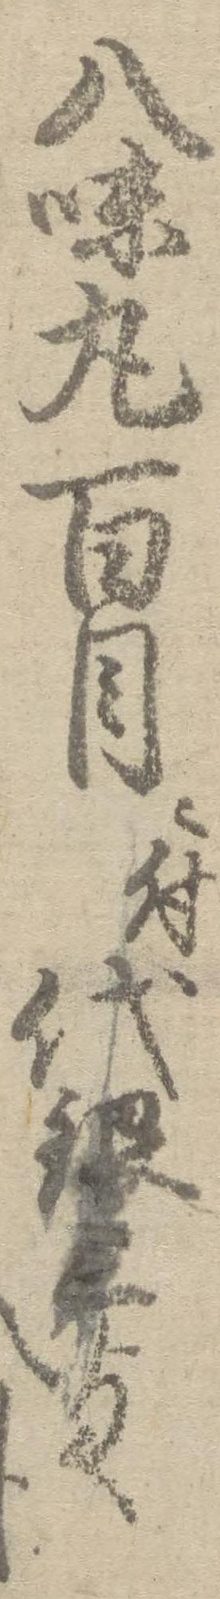六味丸百目付代銀三匁
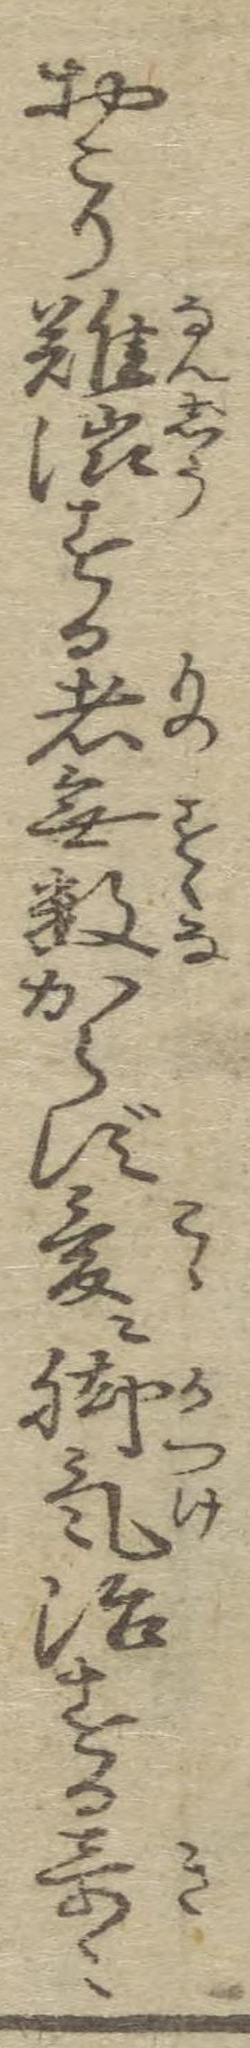おこり難渋する者無数からず爰脚気治する奇々
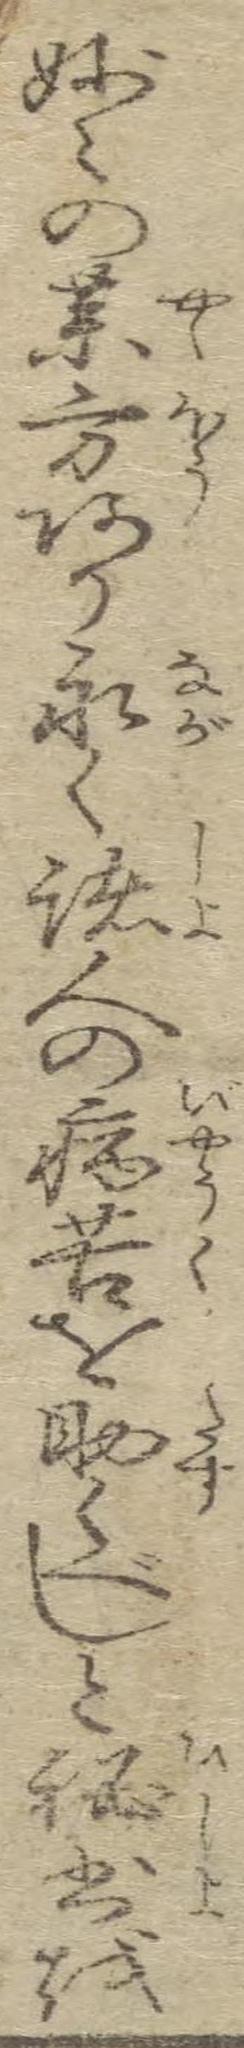妙々の薬方あり永く諸人の病苦を助くべしと秘書を
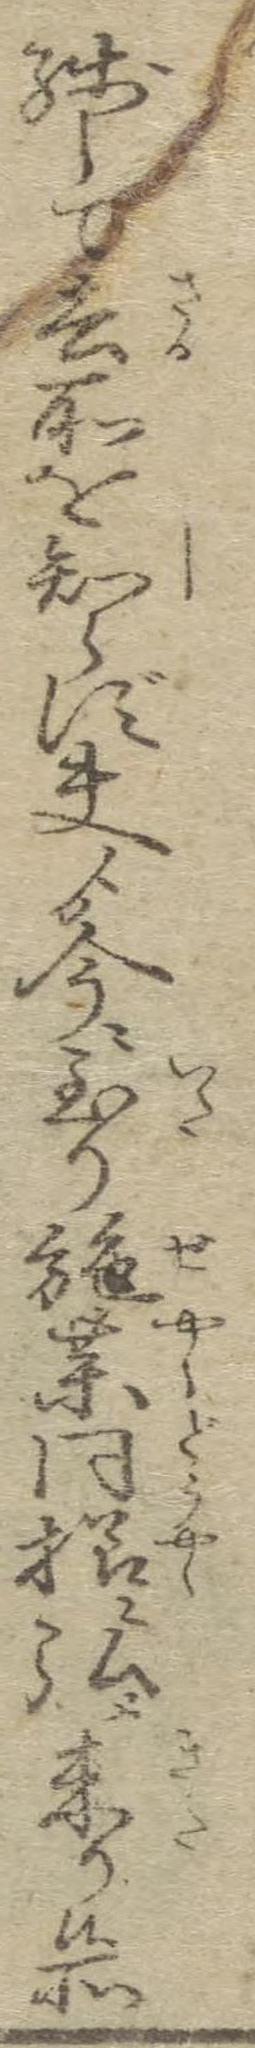残して去所を知らず夫ゟ今至り施薬同様弘来り候所
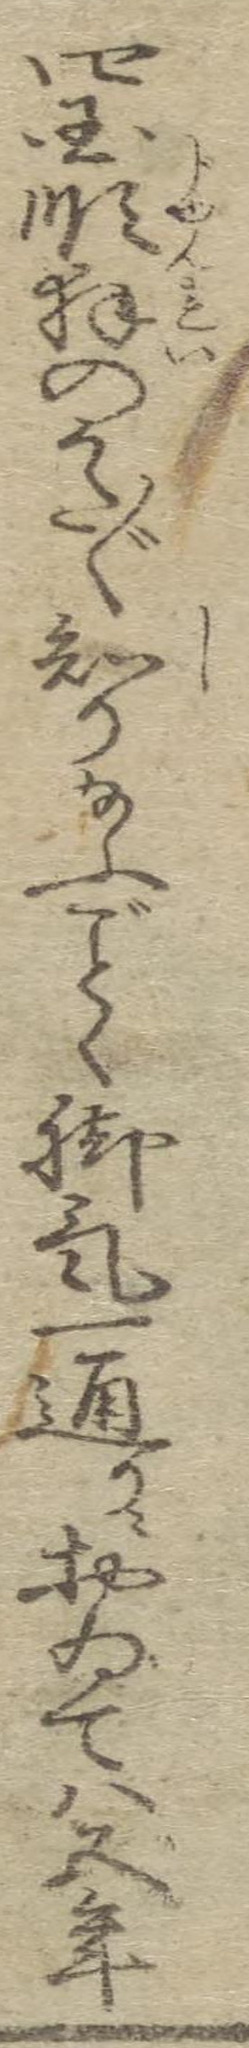四国巡拝のかた〴〵知り給ふごとく脚気一通五年
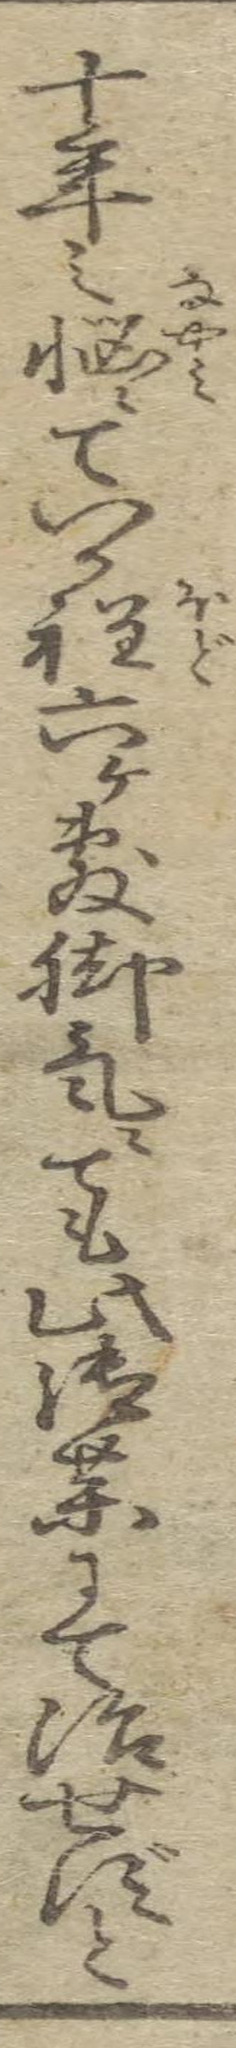十年の悩程六ヶ敷脚気此御薬にて治せずと
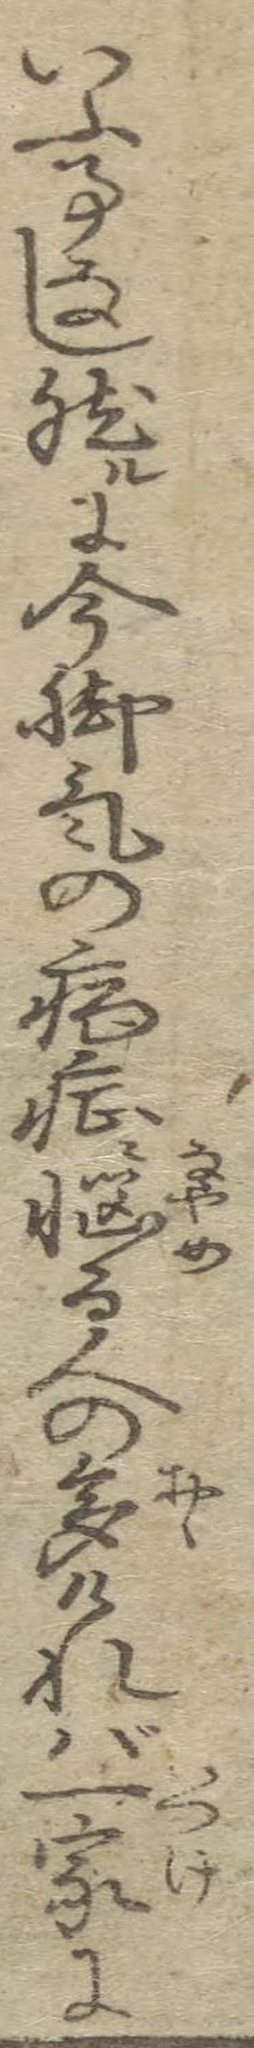いふ事なし然今脚気の病症悩る人の多ければ一家に
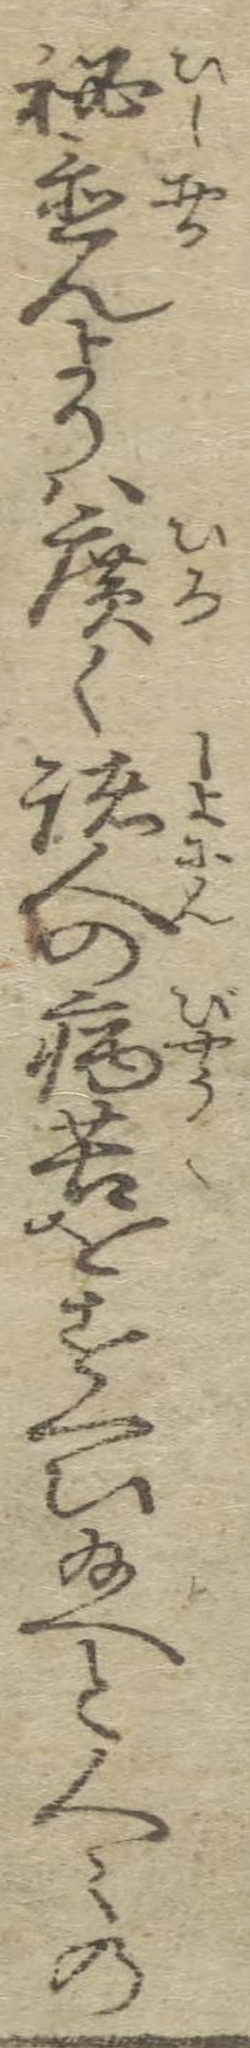秘置んよりは広く諸人の病苦をすくひ給へと人々の
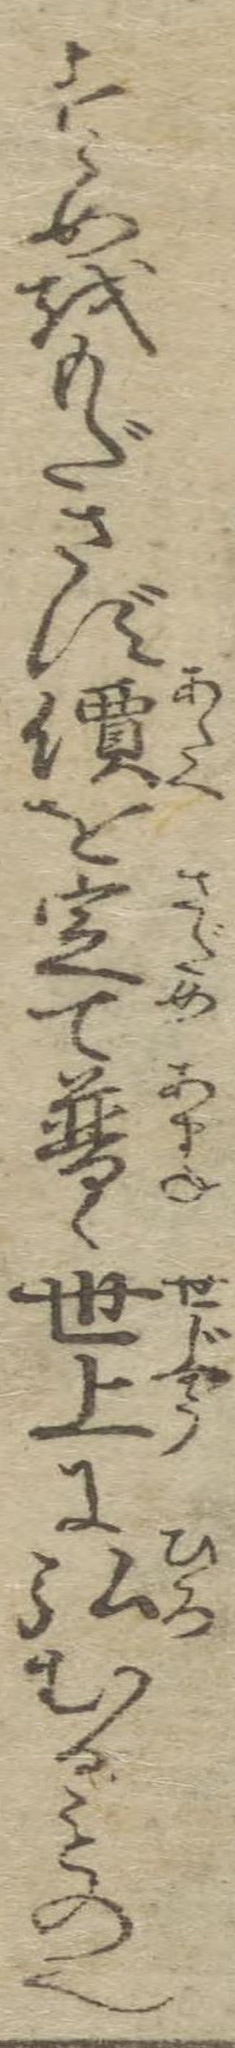すゝめをもださず價を定て普く世上に弘むるもの也
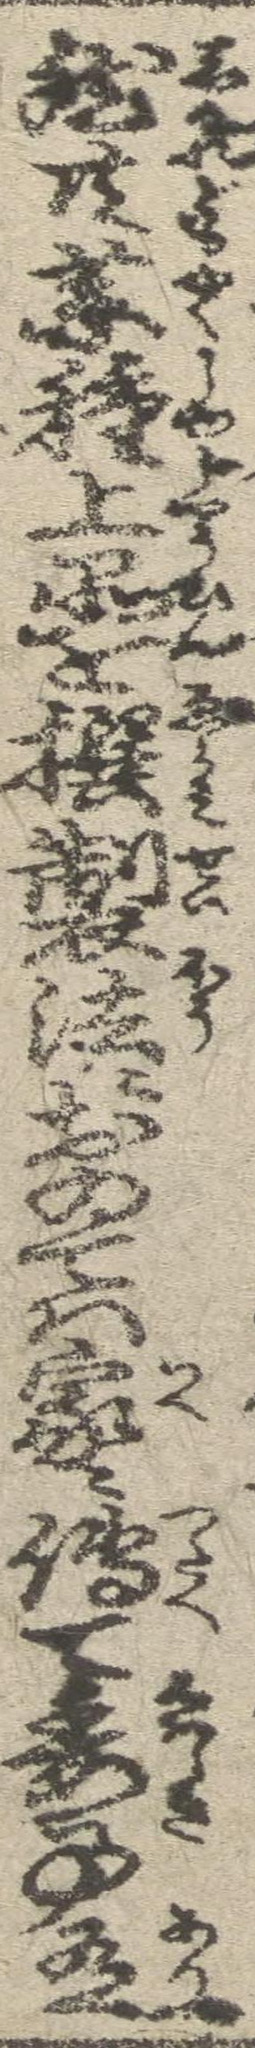然共薬種上品を撰製法家傳て委事有
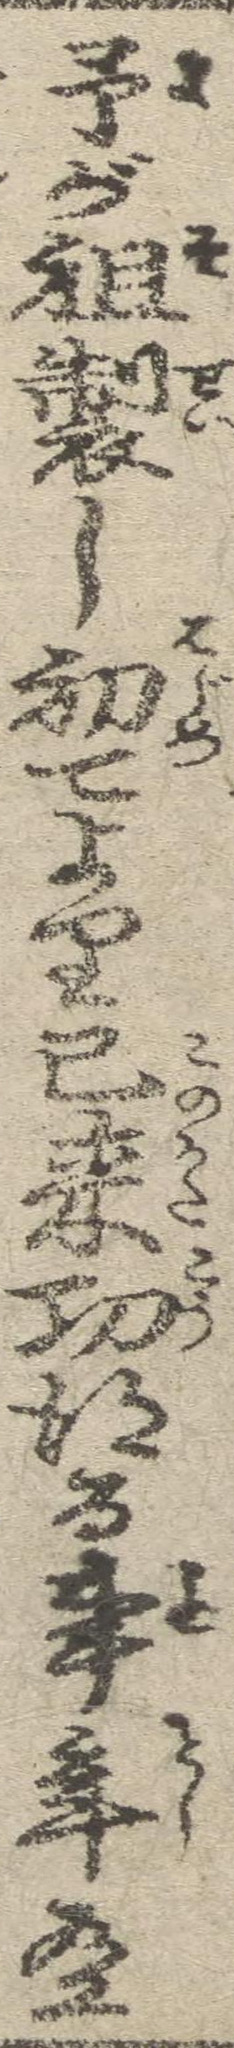予が祖製し初てより已来功得る事年有
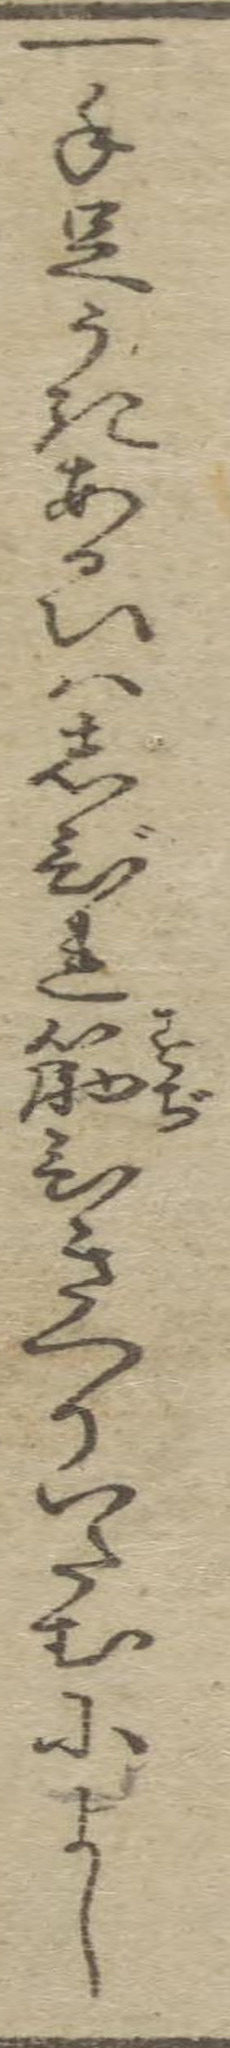一手足うきあるひはしびれ筋ひきつりいたむによし
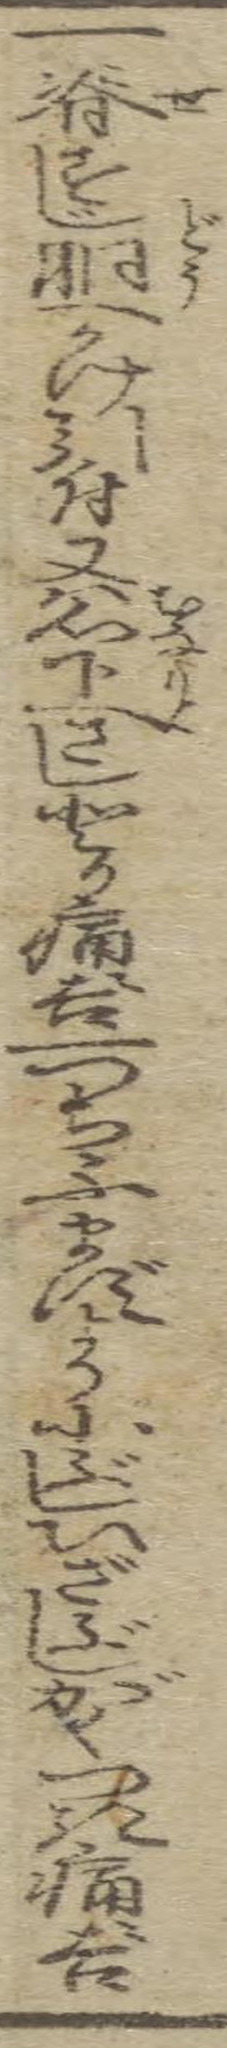一脊すじ胴へかけ引付又は心下へさしとり痛吉一つちふまずより小ぶしひざぶしがくつき痛吉
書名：浪華薬種問屋能書張交帖. 二
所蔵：国立国会図書館 National Diet Library, JAPAN
